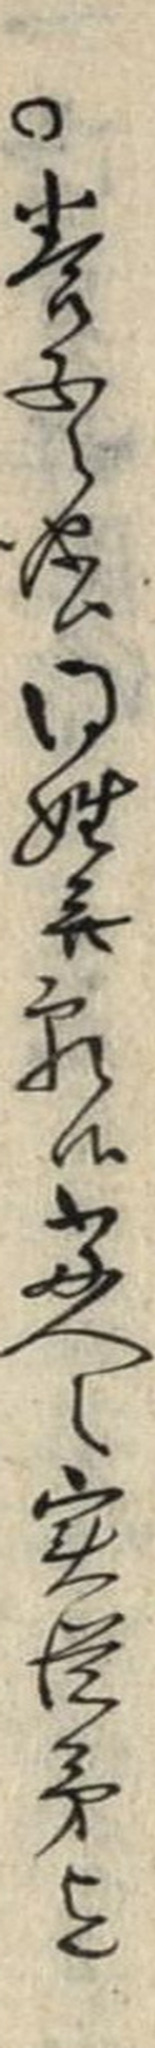○養子之儀ハ同姓并願候当人之実従弟迄
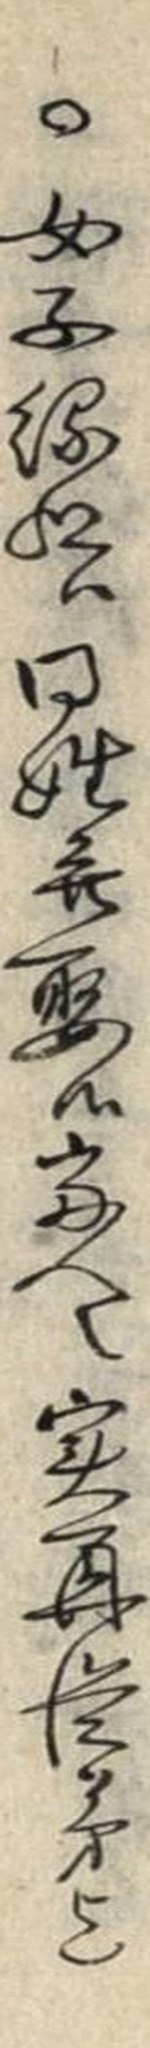○女子縁組ハ同姓并娶候当人之実再従弟迄
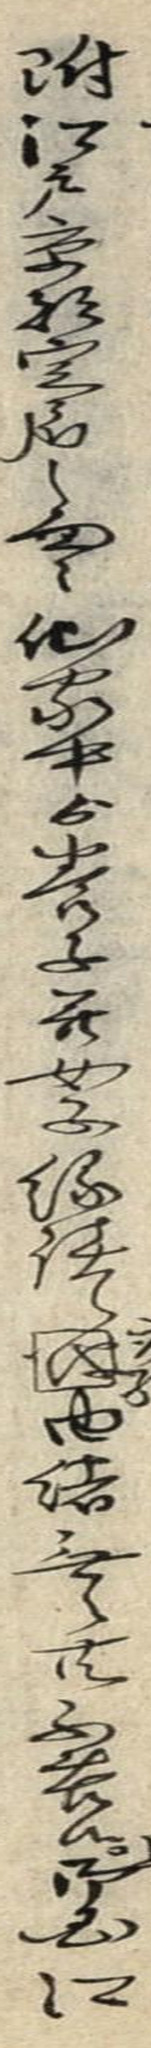附江戸京都定府之面々他家中ゟ養子并女子縁談之取組儀由緒無之共不苦候。◦且御国江
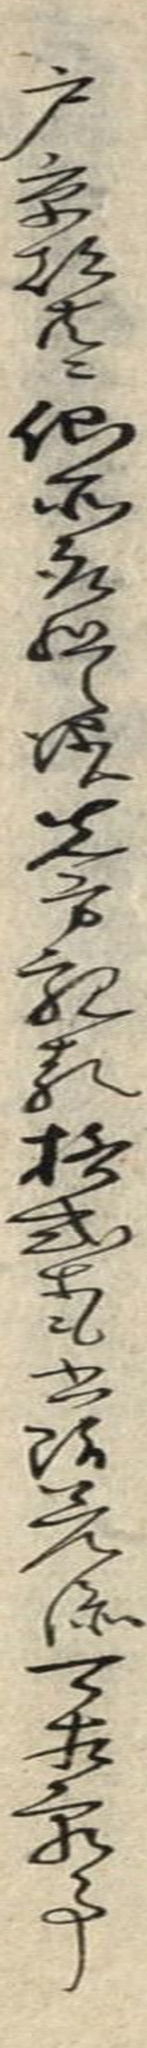戸京都共ニ他所取組之儀ハ先方親類格式等も書附差添可相願事
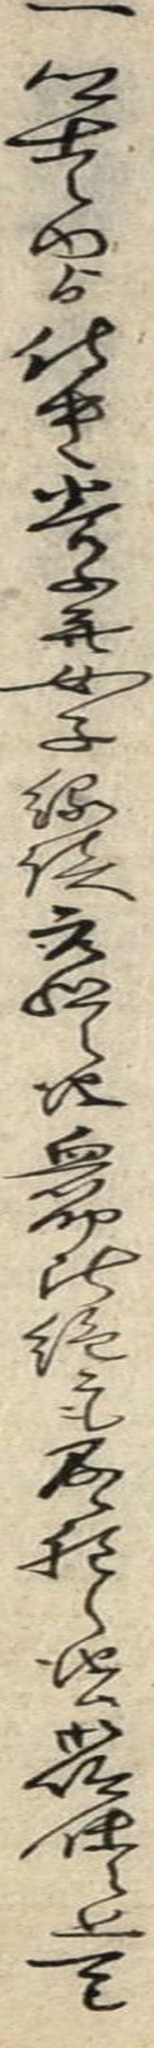一郷士之内ゟ侍中ヘ養子并女子縁談取組之儀血筋断絶ニも及候程之儀ハ御吟味之上可被
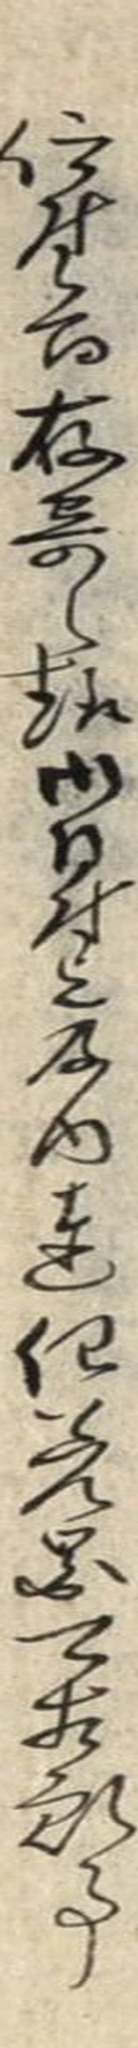仰付候間存寄之趣御目付迄及内達任差図可相願事
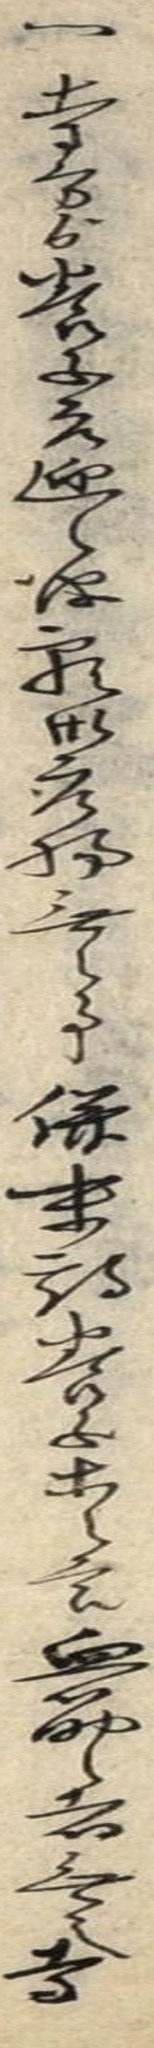一寺方ゟ養子取迎候儀願御取揚無之事併末期養子等之節血筋之者無之寺
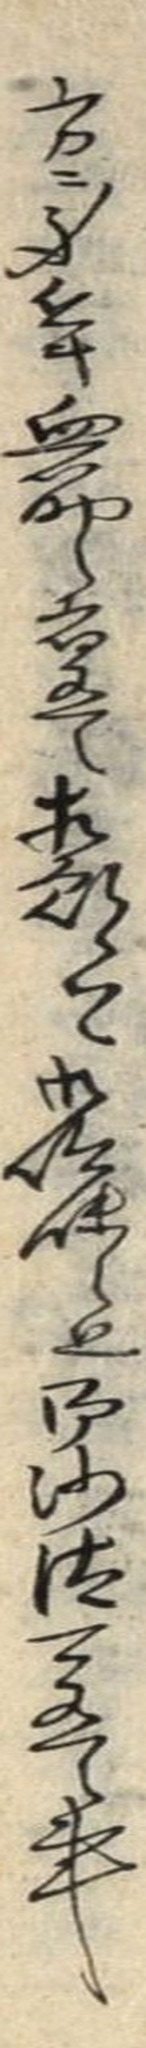方ニ身を近キ血筋之者有之相願候ハヽ御吟味之上御沙汰可有之事

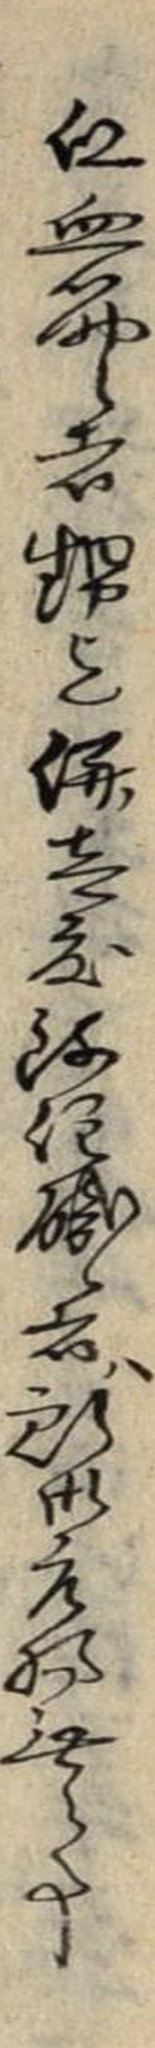但血筋之者甥迄併壱度致住職候者ハ願御取揚無之事
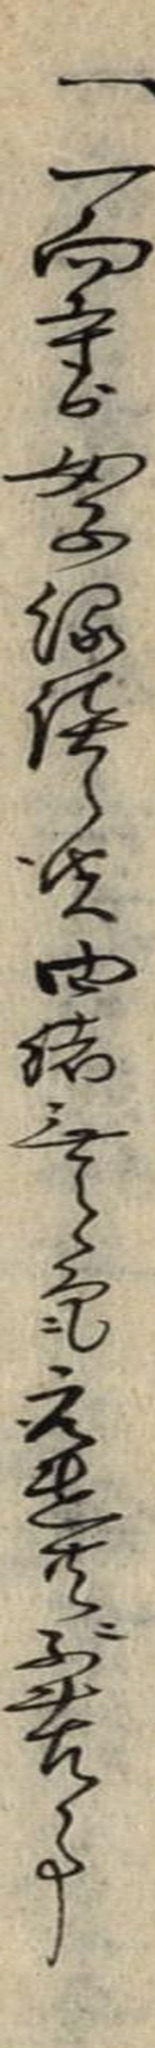一一向寺ゟ女子縁談之儀ハ由緒無之候而も取遣共ニ不苦事
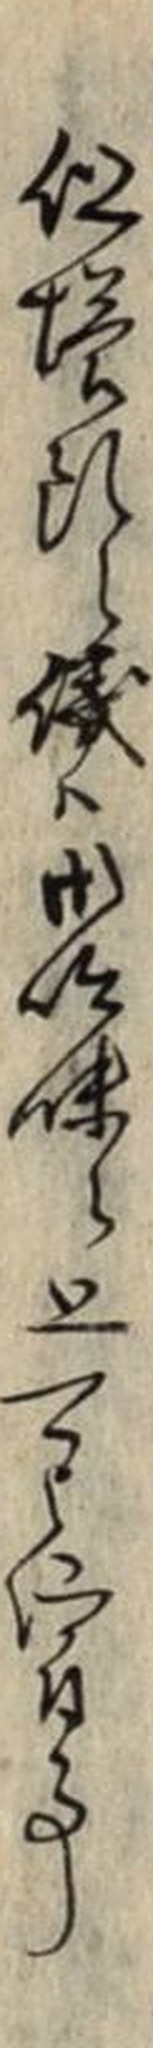但塔頭之儀ハ御吟味之上可被仰付事
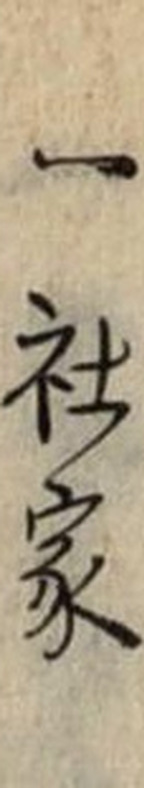一社家
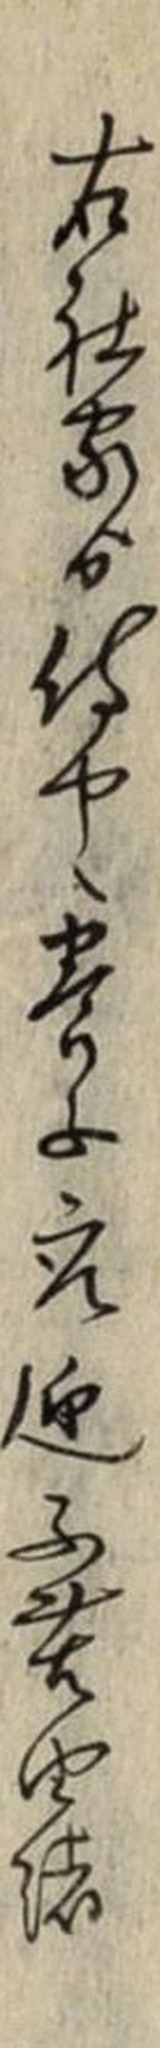右社家ゟ侍中ヘ養子取迎不苦由緒
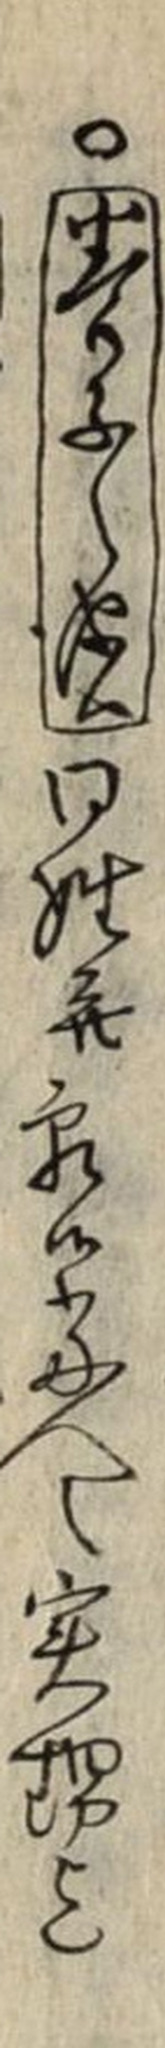○養子之儀ハ同姓并願候当人之実甥迄
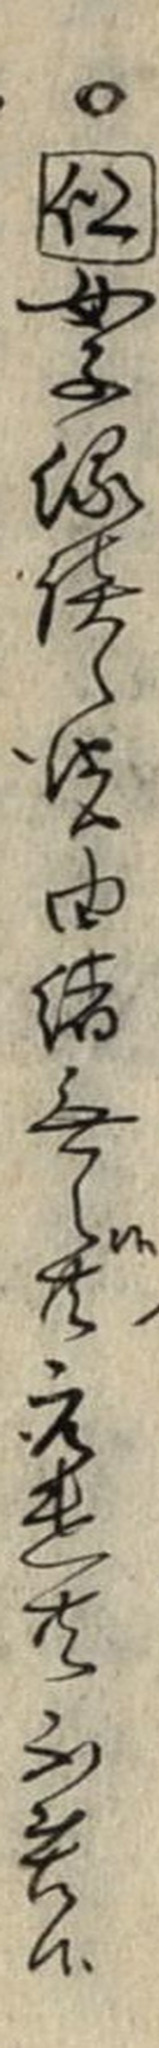○但女子縁談之儀ハ由緒無之候共取遣共不苦候
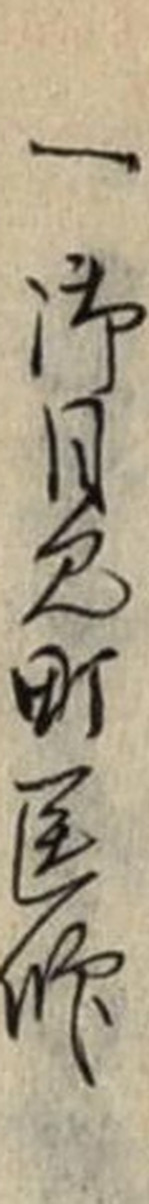一御目見町医師
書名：養子縁組之部
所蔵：福井県文書館 Fukui Prefectural Archives
